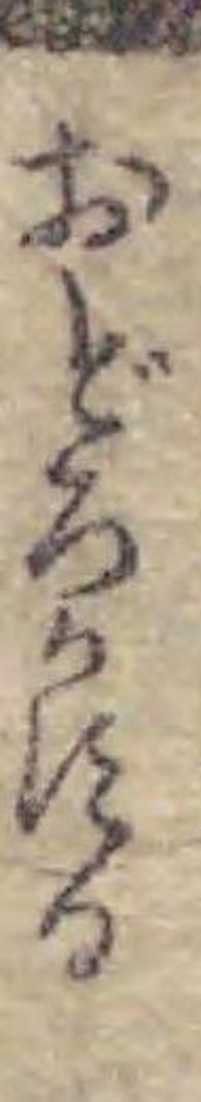おどろかする
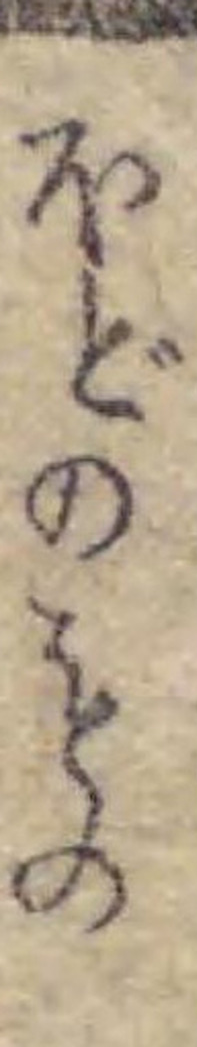ほどのもの
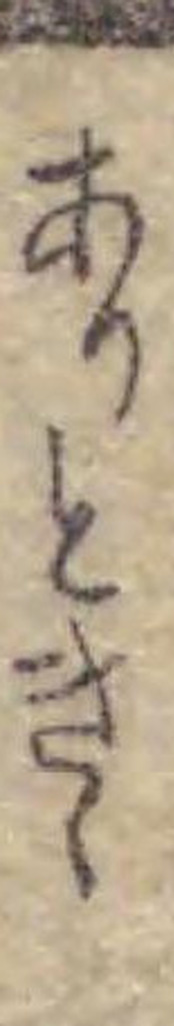ありときゝ
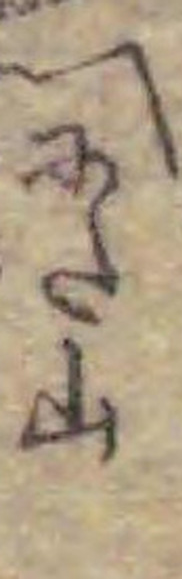〽にた山
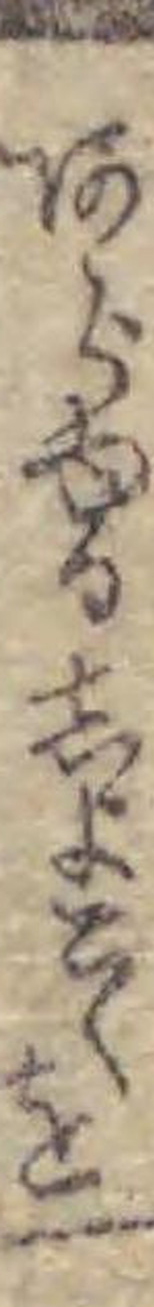あらゆるしよこくを
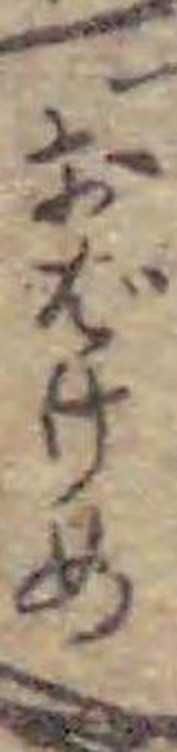おばけめ
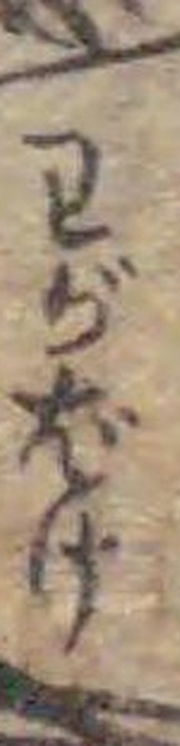わがばけ
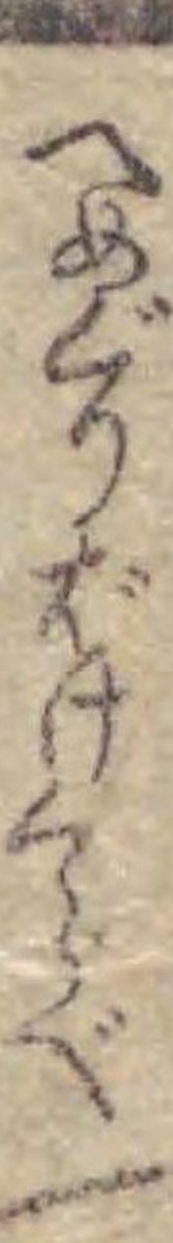へめぐりばけくらべ
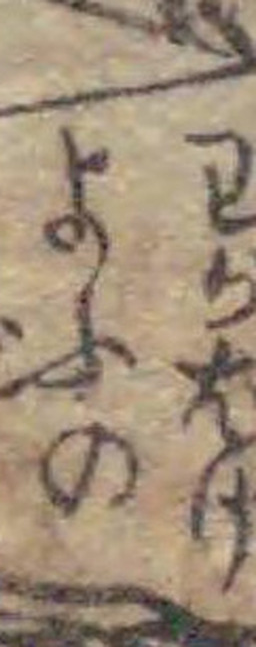よふの
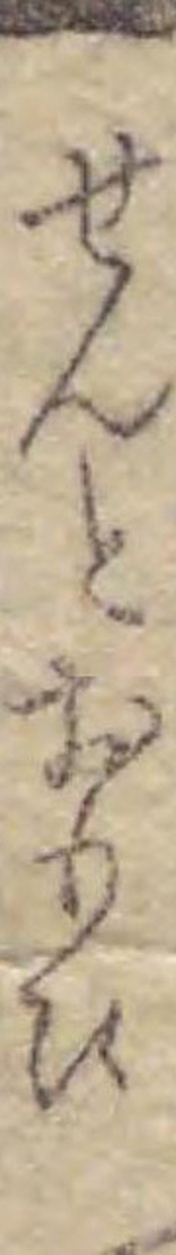せんとおもひ
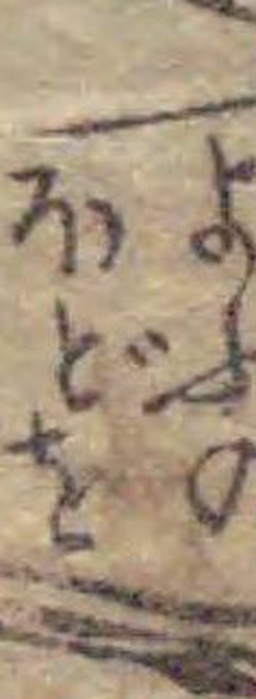ほどを
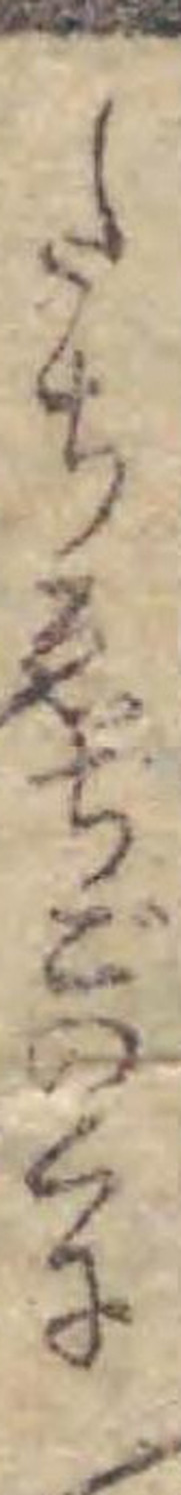たちゑちごのくに
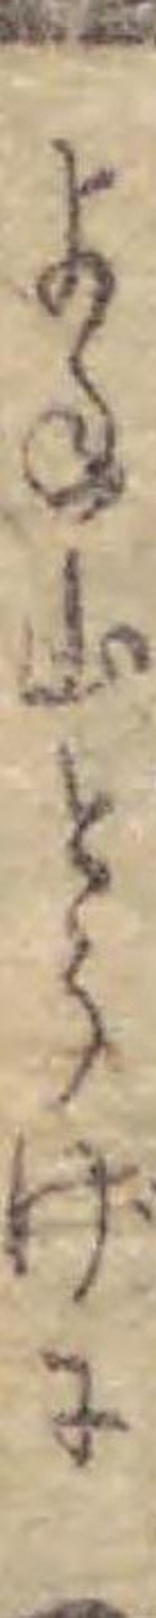よね山とうげに
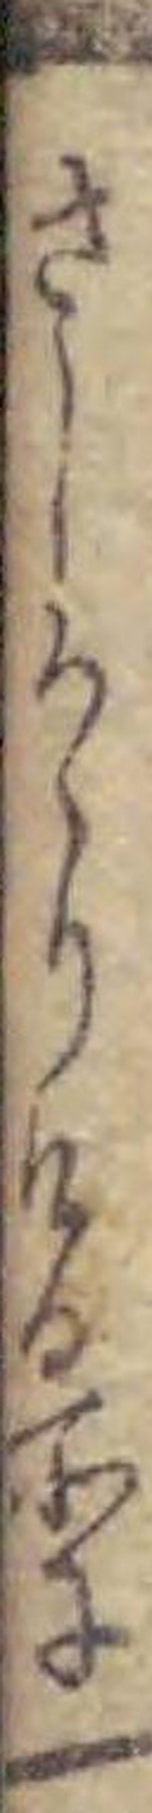さしかゝりける所に
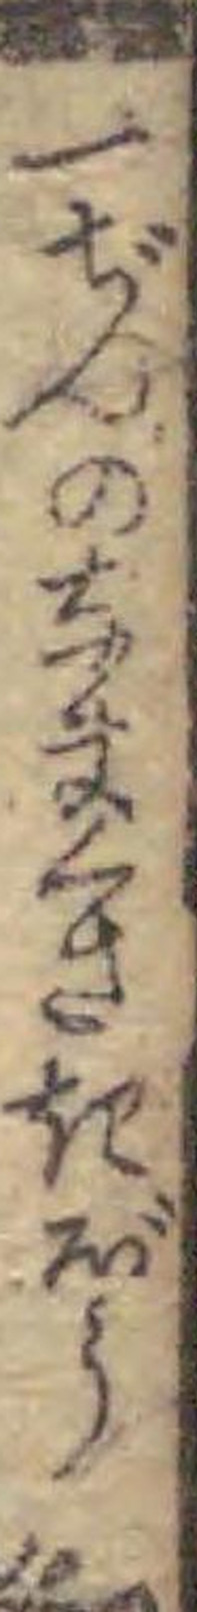一ぢんのなまくさきぼう
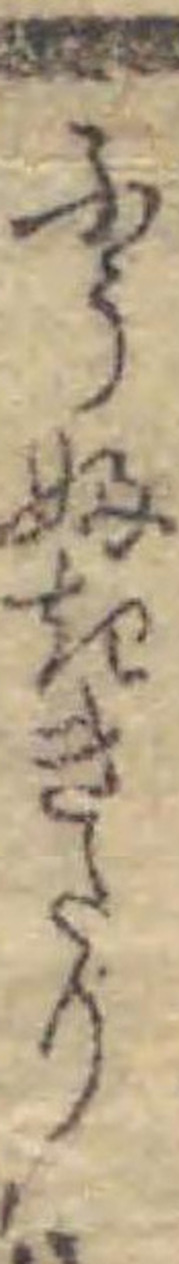ふうふききたり
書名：化物世界夜半嵐 : 3巻
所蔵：国立国会図書館 National Diet Library, JAPAN
